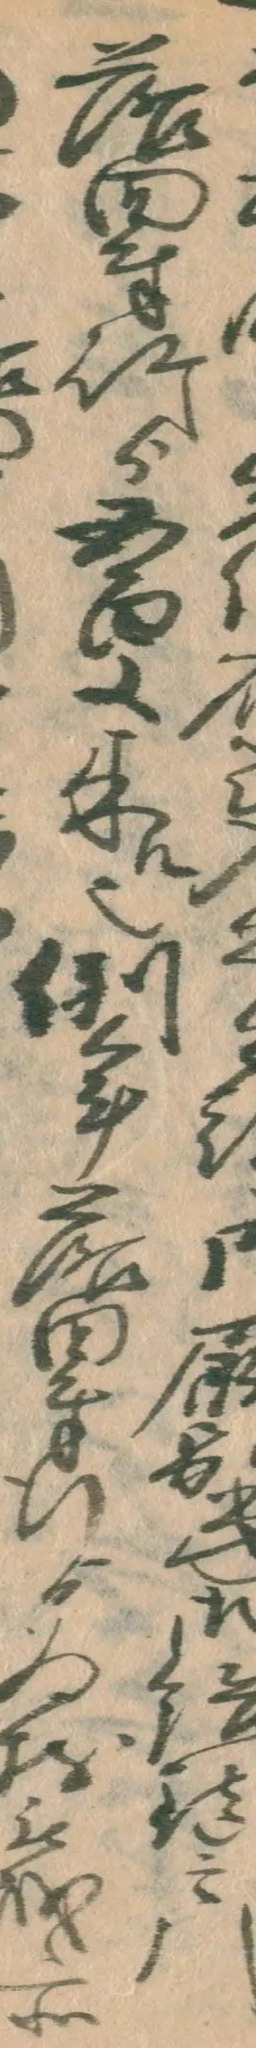落田奉行ゟ五百文来ル也例年落田奉行ゟ為持被越候所
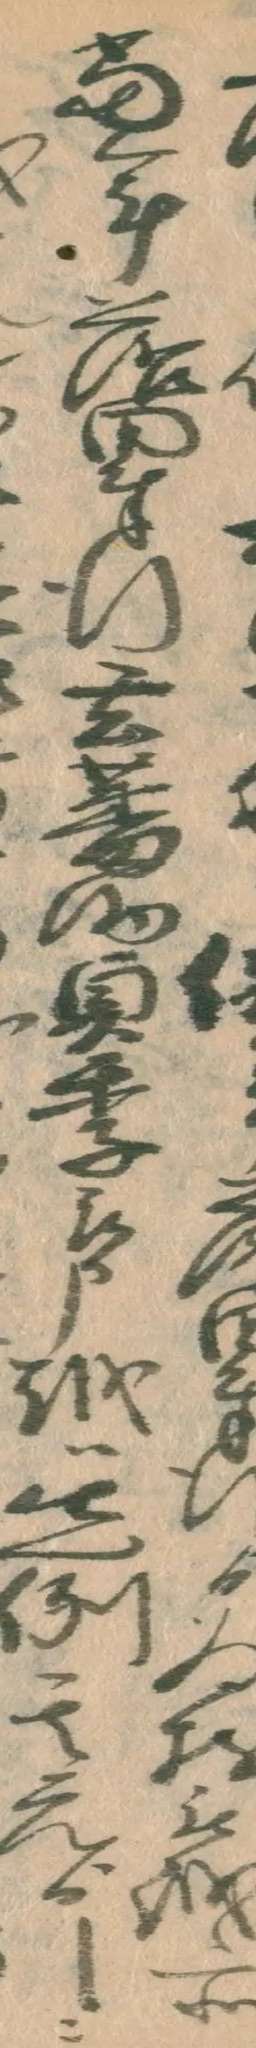当年落田奉行玄蕃助貞季被申越ハ先例其元ゟ引ニ
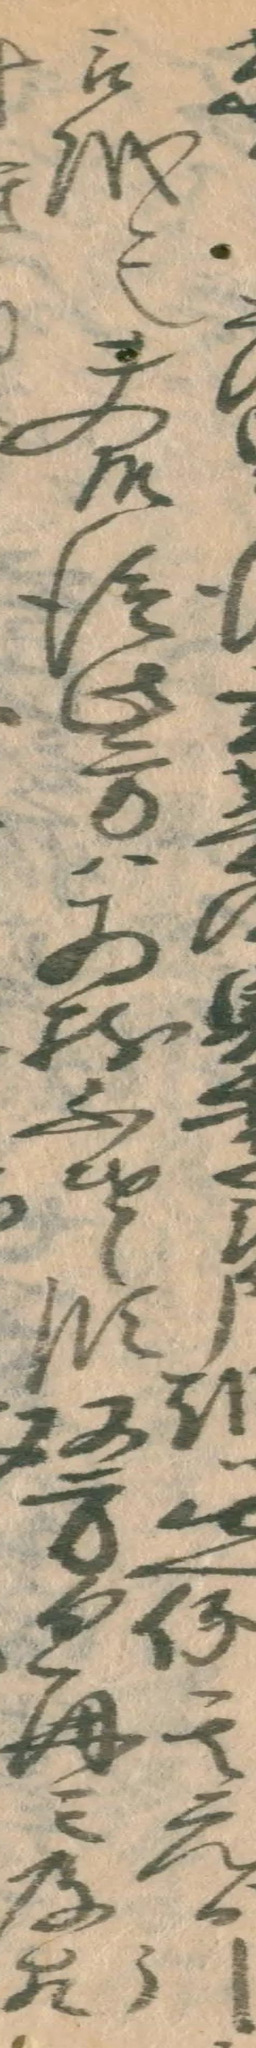被越候也夫故従此方ハ為持不遣候段双方ゟ再三及相
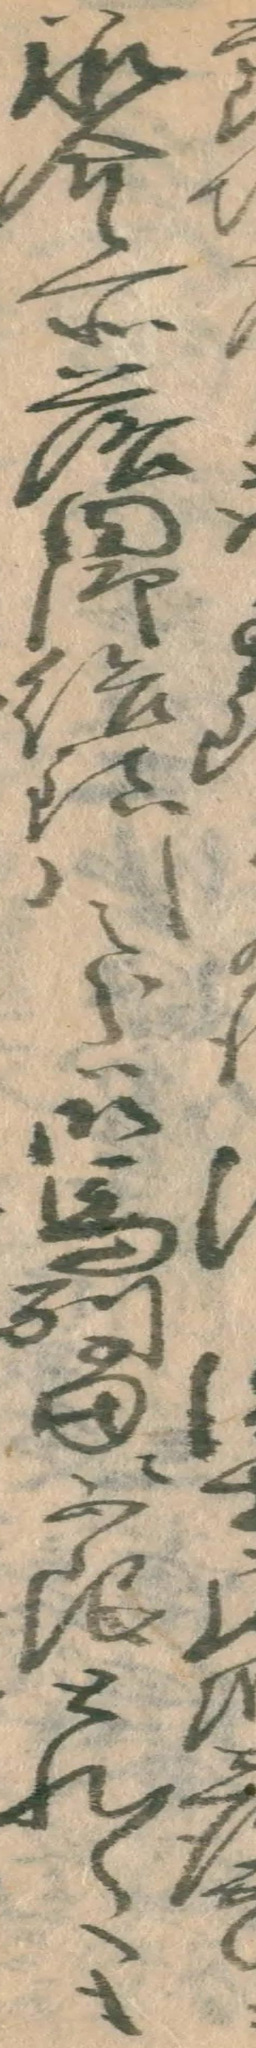承合候所落田御結鎮引之分ハ御馬別当ニ不限それ〳〵へも
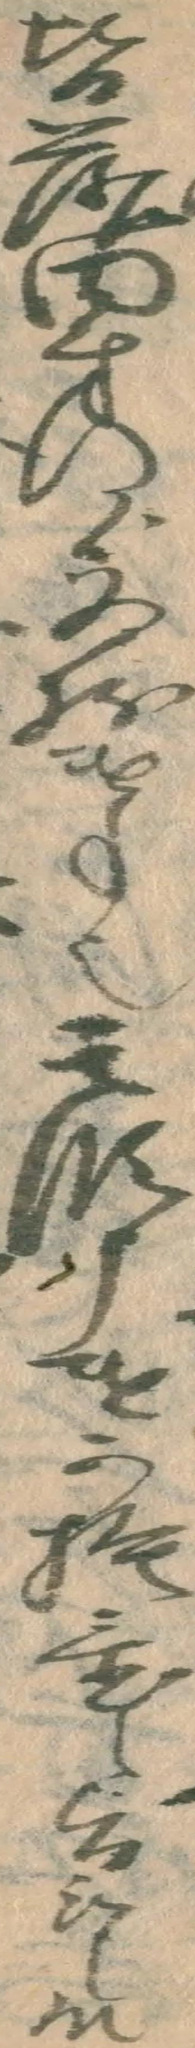皆落田奉行ゟ為持遣事也其段申遣可捨置候旨被申候故
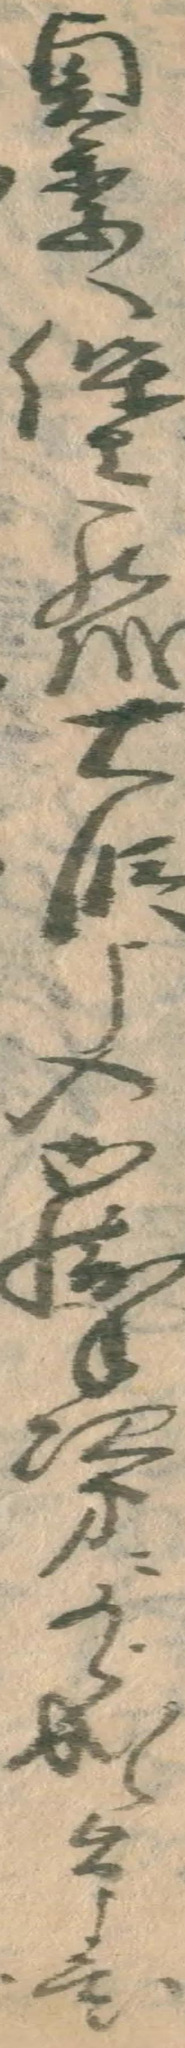貞季へ保土罷越右段申入御勝手次第ニ可被成候旨申置
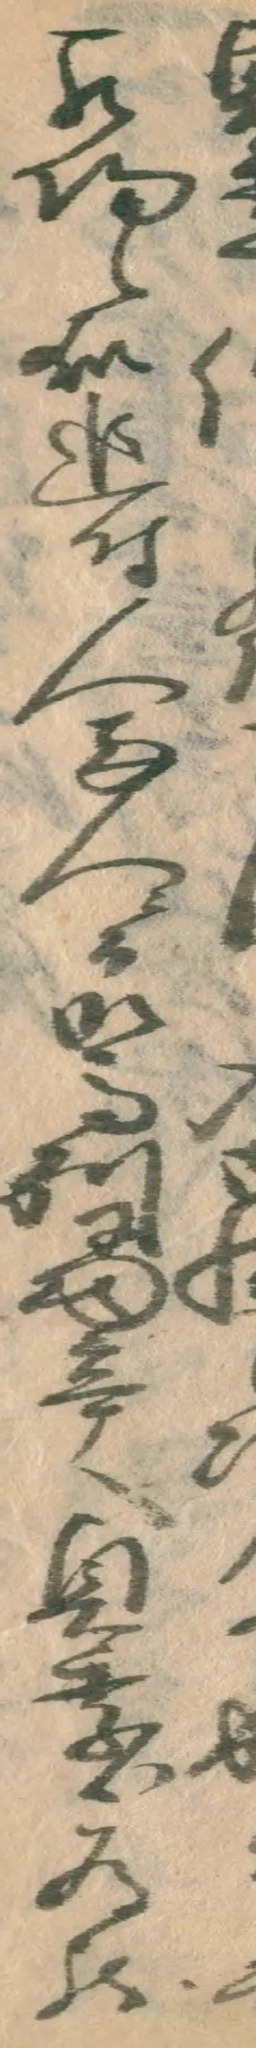罷帰候処追付人両人ニ而御馬別当亭へ貞季ゟ為持

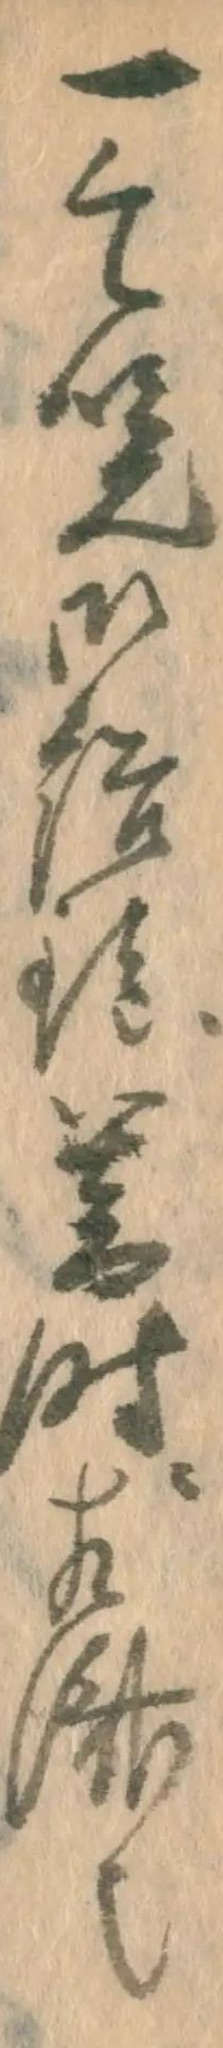一今晩御結鎮暮時ニ相済也
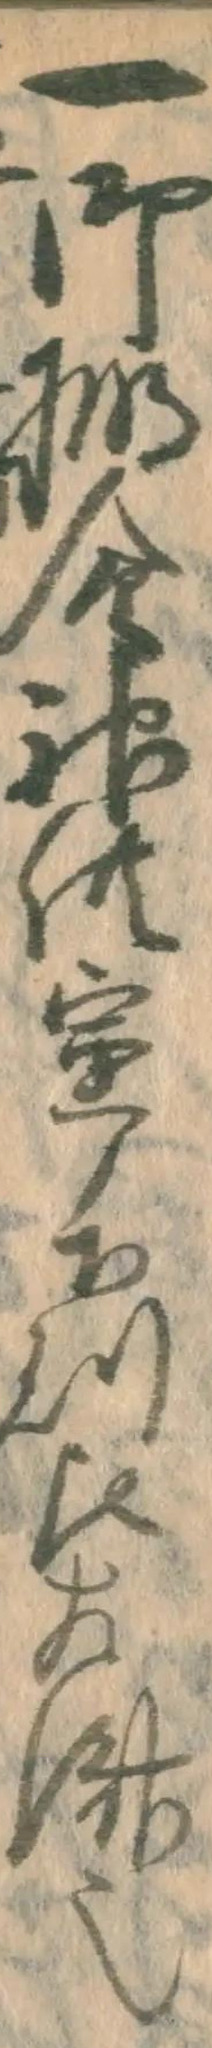一御棚会神供寅ノ下刻比相済也
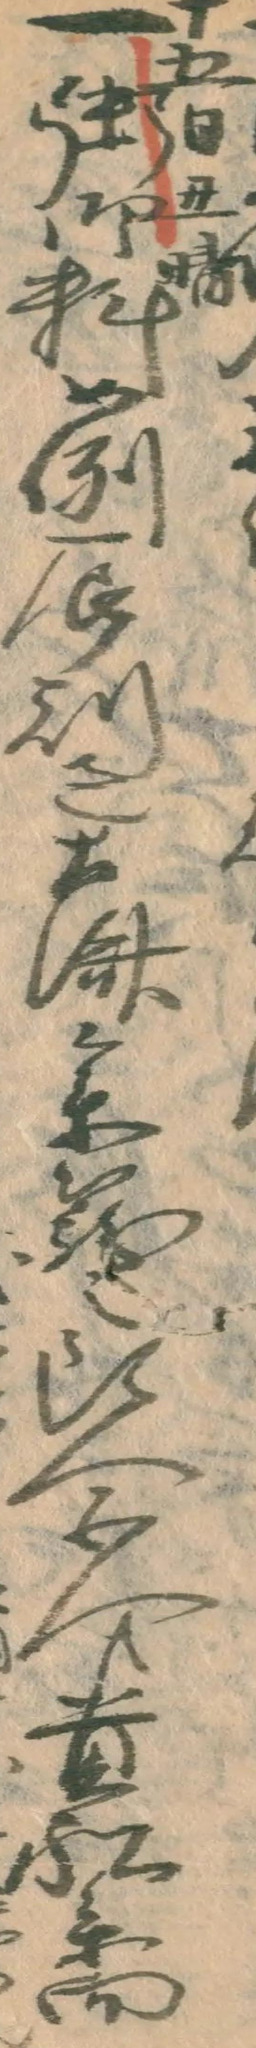一粥御料如例辰ノ刻迄相済参籠之頭人五人共貴船参向
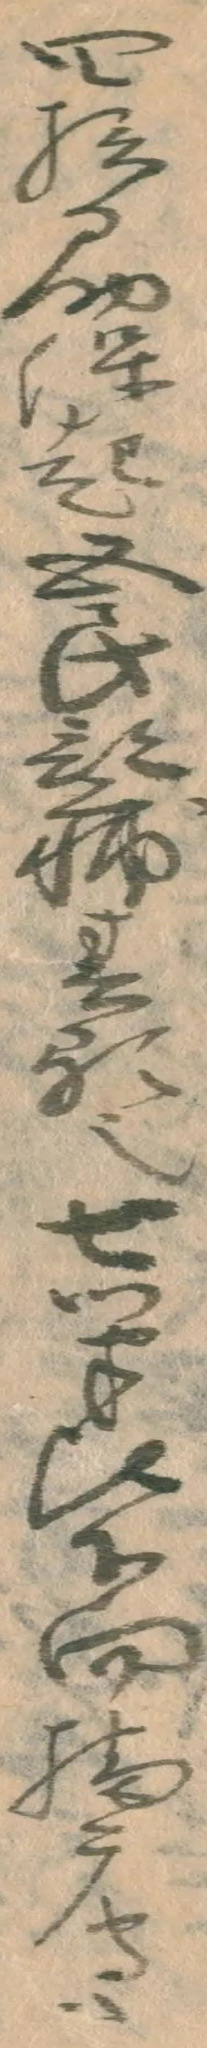四帰部助保起五民部輔春顕也七ツ半頃下向播磨守ハ
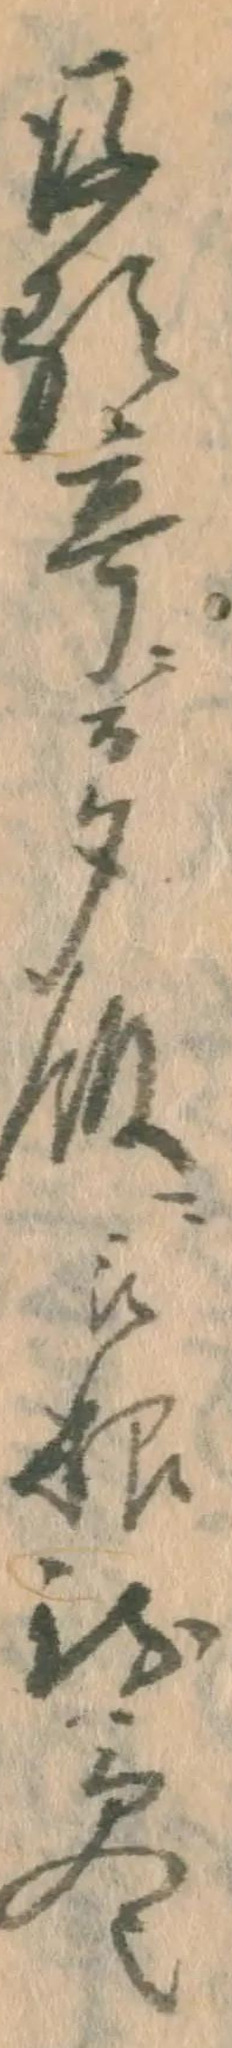存顕亭ニ而夕飯ニ被待受也
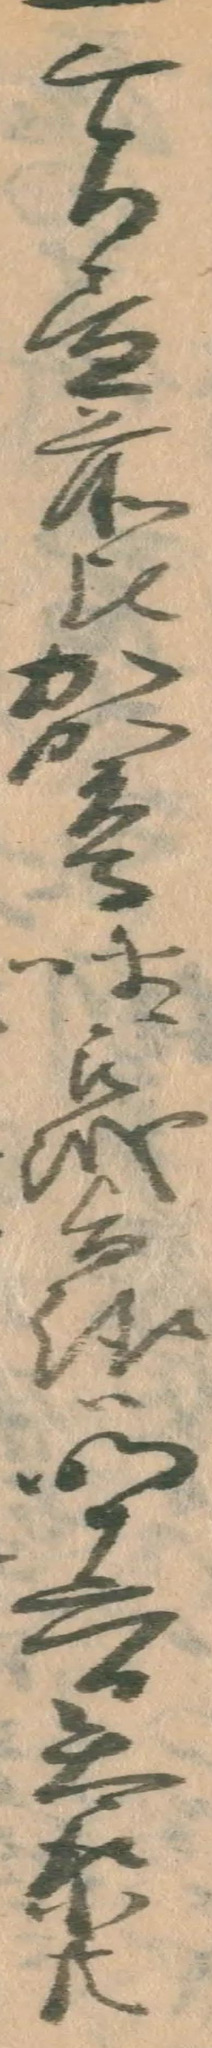一今日昼前比加賀守呼ニ被越旨趣ハ明十六日矢取小共
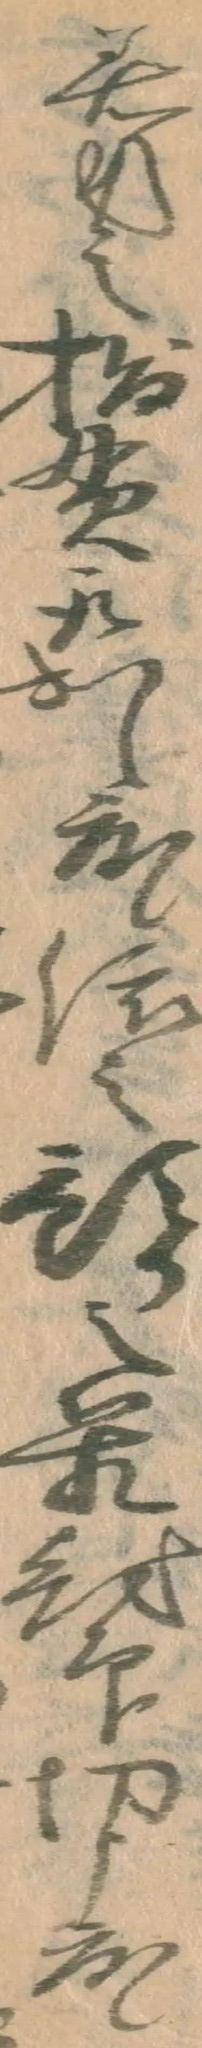着用之指貫取出し度候依之預り之箱封印切申度候間
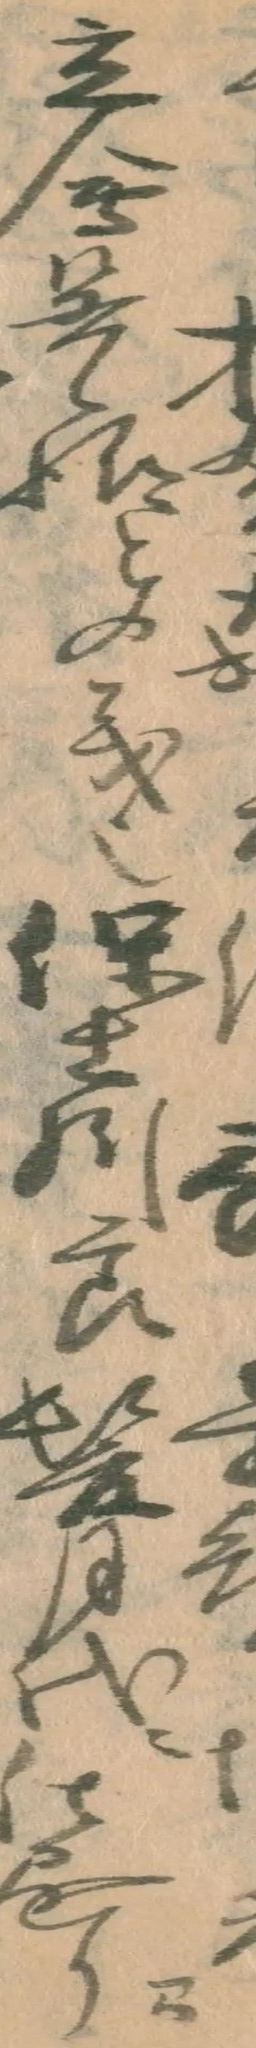立会呉候様ニとの義也保士折節髪月代ニ仕懸り
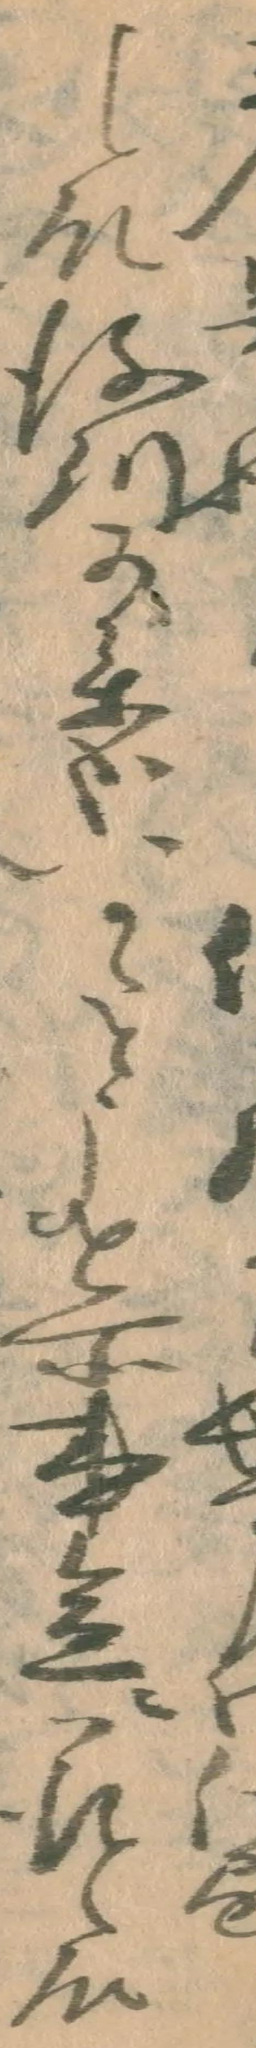申候故後刻可参哉いかゝと申遣候所事急ニ御座候故
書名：賀茂社記録. 第60冊
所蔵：国立国会図書館 National Diet Library, JAPAN
